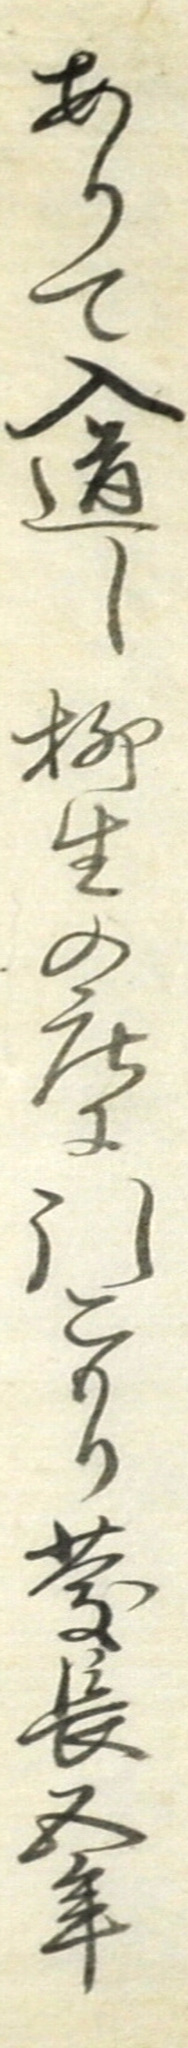ありて入道し柳生の庄に引こもり慶長五年
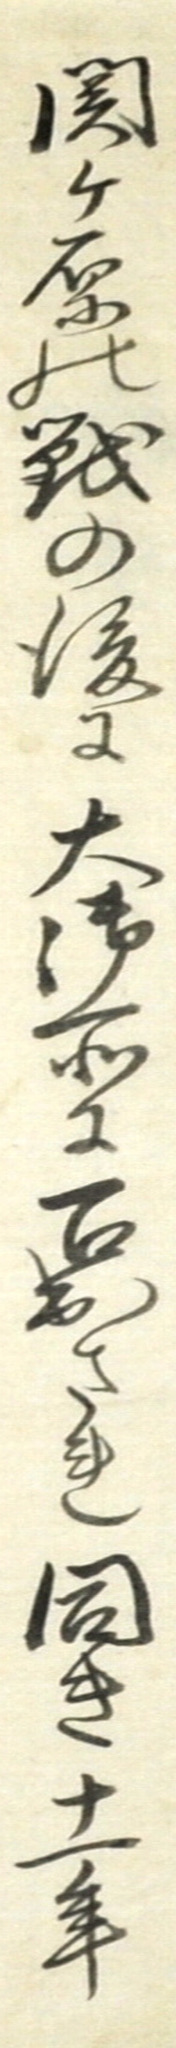関ヶ原の戦の後に大御所に召出され同き十一年
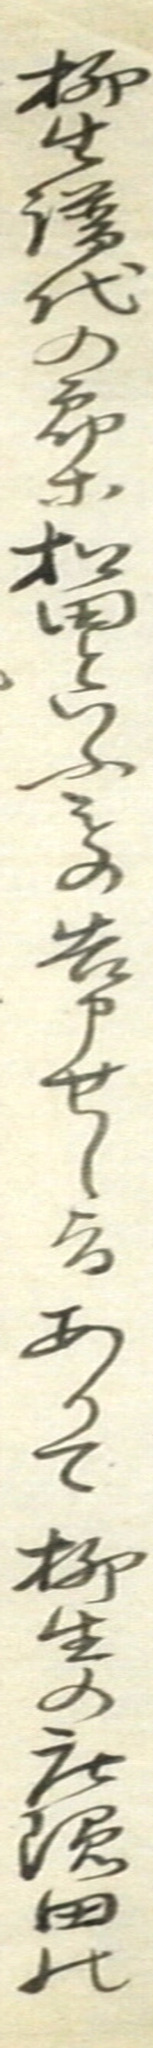柳生譜代の郎等松田といぬもの告申せし旨ありて柳生の庄隠田の
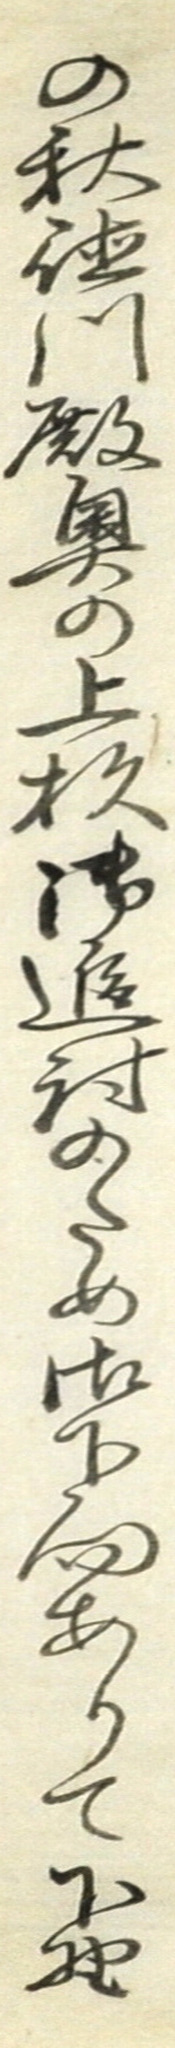の秋徳川殿奥の上杉御追討のため御下向ありて下野
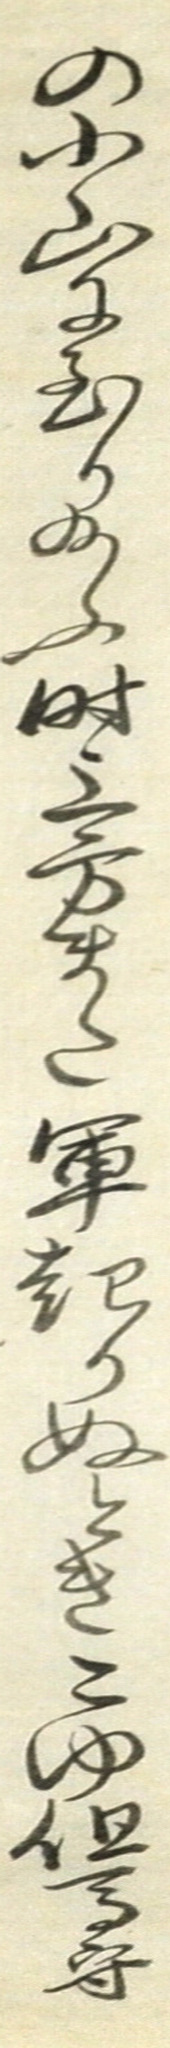の小山に至り給ふ時上方また軍起りぬときこゆ但馬守
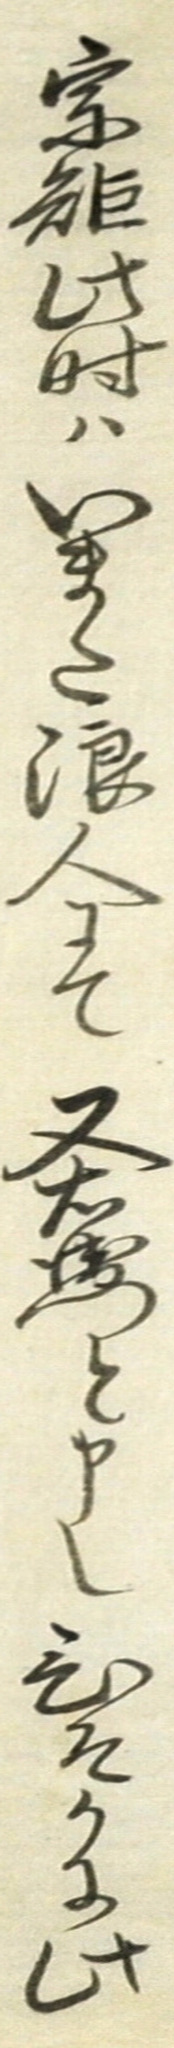宗矩此時はいまた浪人にて又右衛門と申しひそかに此
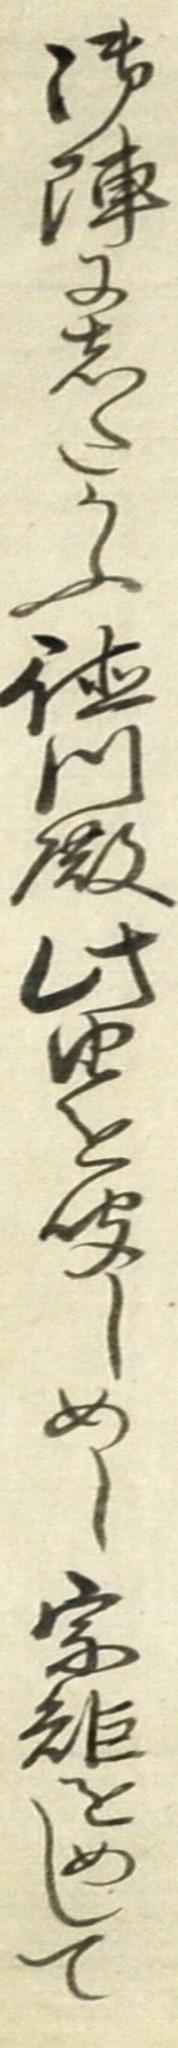御陣にしたかふ徳川殿此由を聞しめし宗矩をめして
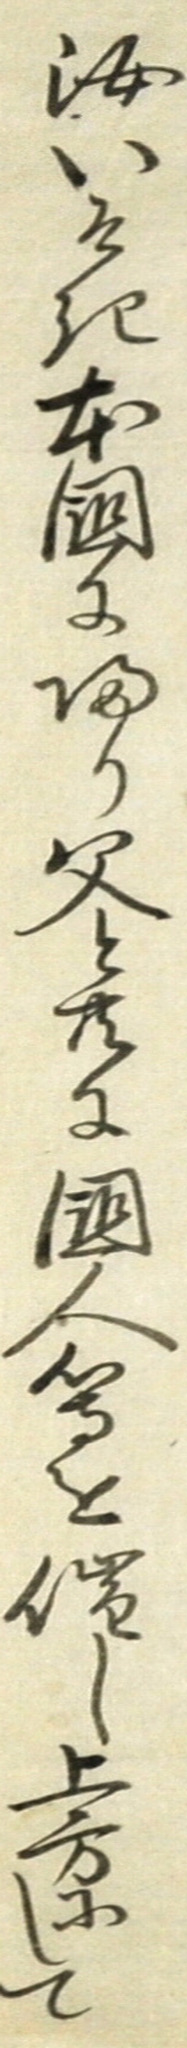汝いそき本国に帰り父と共に国人等を催し上方にして
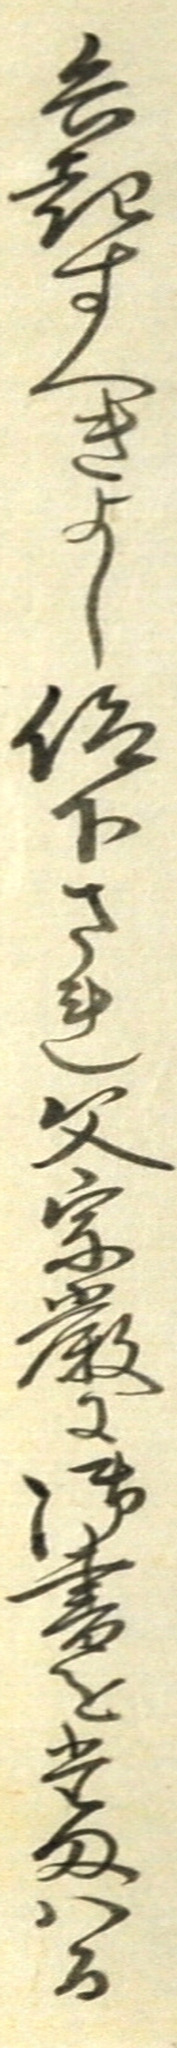兵起すへきよし仰下され父宗厳に御書をたまはる

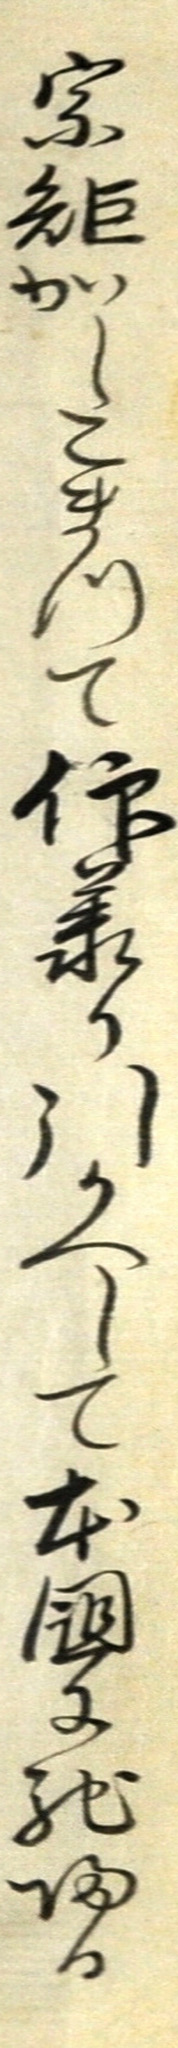宗矩かしこまつて仰承り引かへして本国に馳帰る
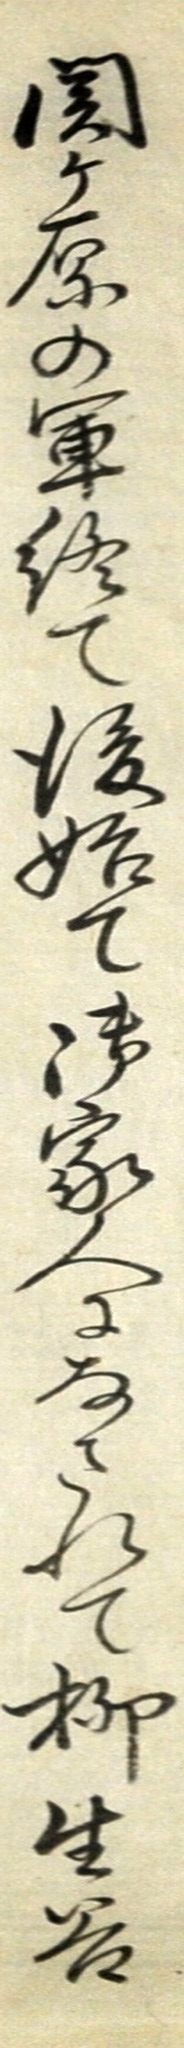関ヶ原の軍終て後始て御家人になされて柳生谷
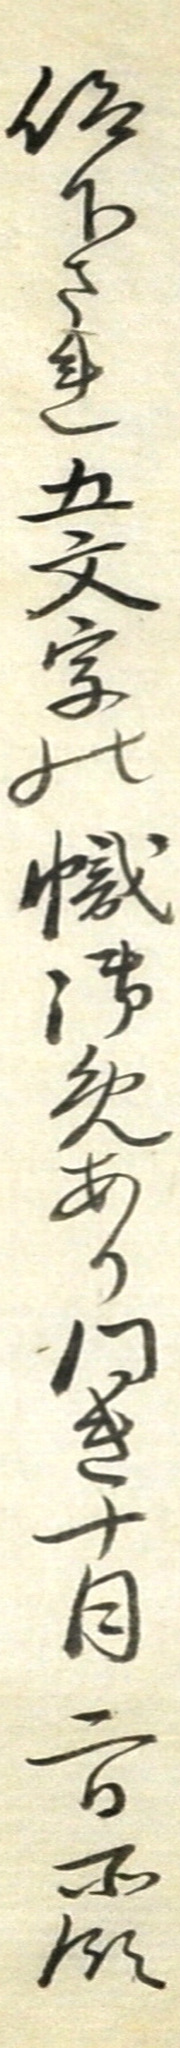仰下され五文字の幟御免あり同き十月二日所領
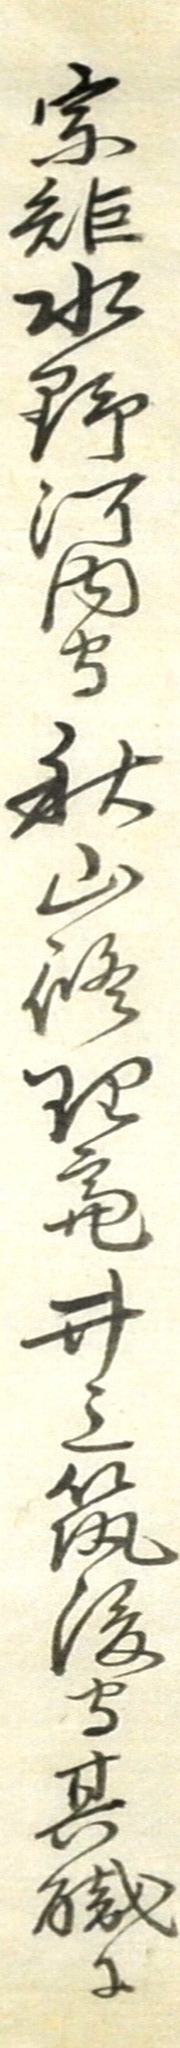宗矩水野河内守秋山修理亮井上筑後守其職に
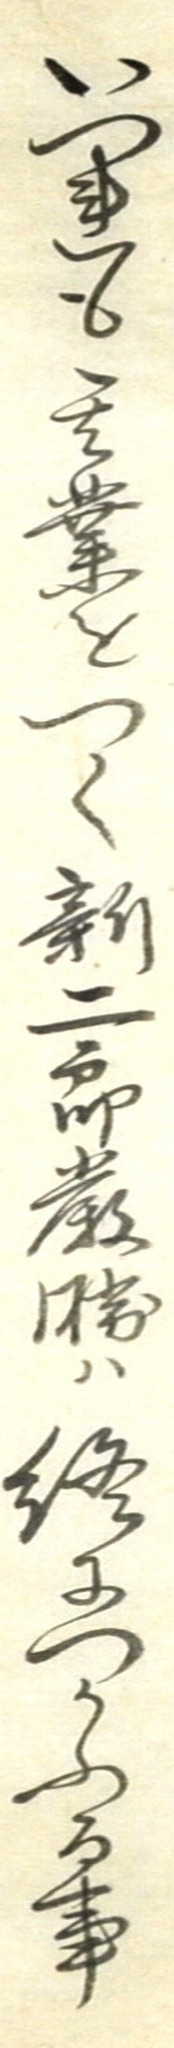いつれも其業をつく新二郎厳勝は終につかふる事
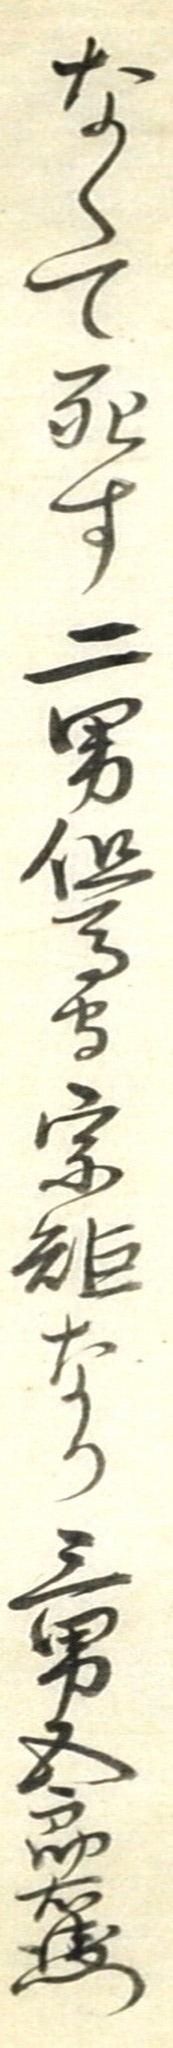なくて死す二男但馬守宗矩なり三男五郎右衛門
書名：藩翰譜（六）
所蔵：伊那市立高遠町図書館・合同会社AMANE
